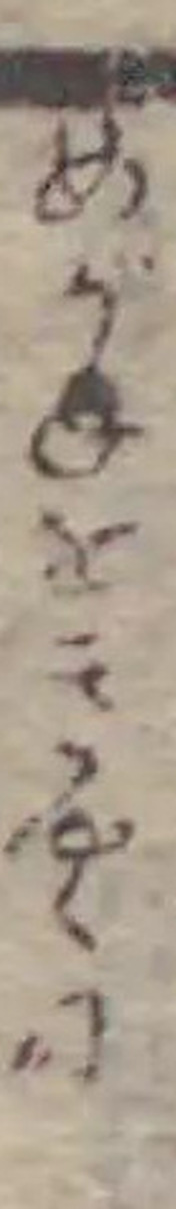めがねをきやくに
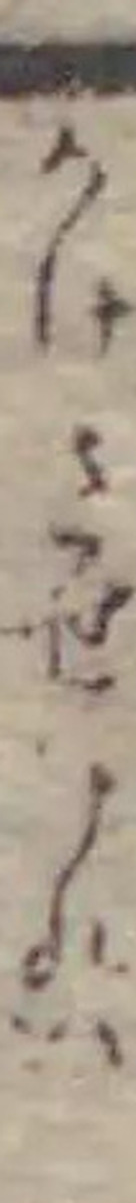かけさせけれは
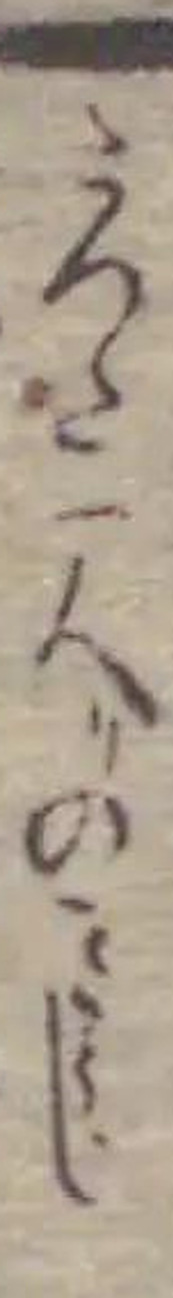たつた一人ㇼのきうじ
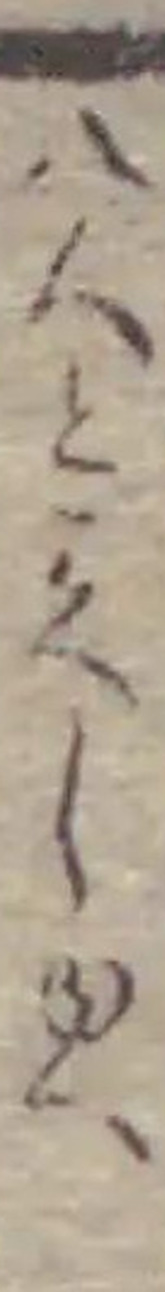八人とみへしゆへ
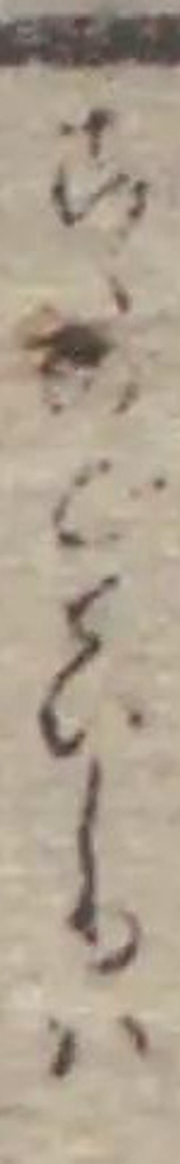こゝのごていしゆは
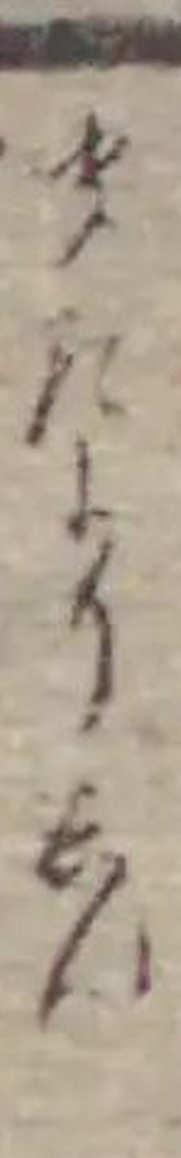聞たよりしん
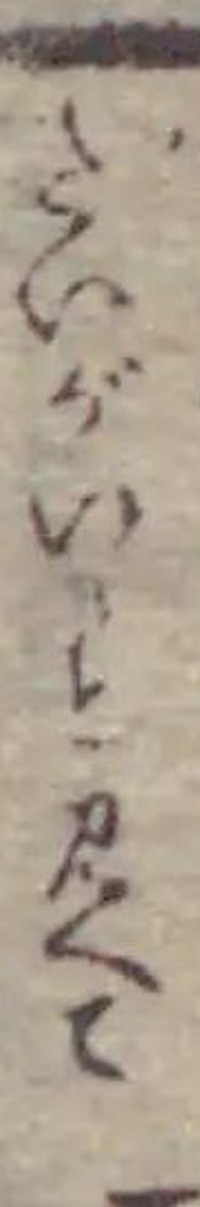たいがいゝと見へて
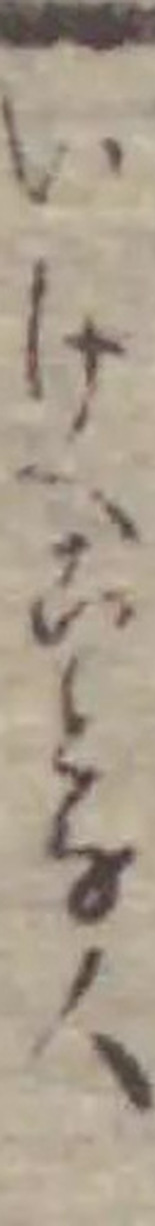いけへことな人
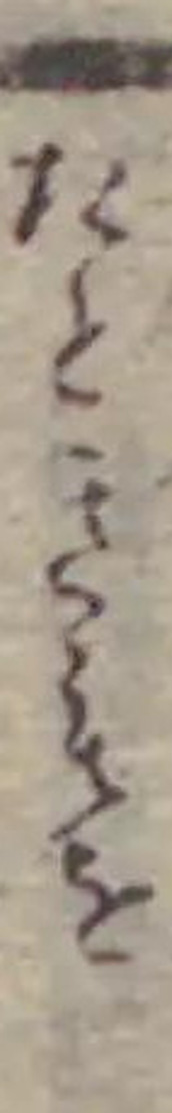たときもを
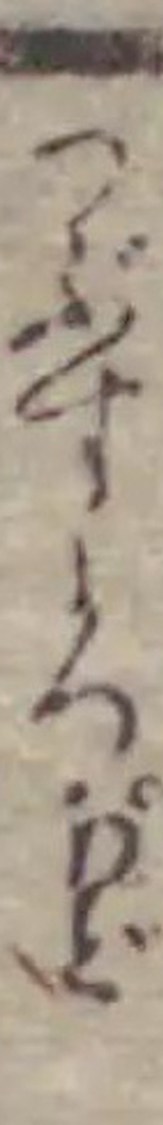つぶすよつぽど
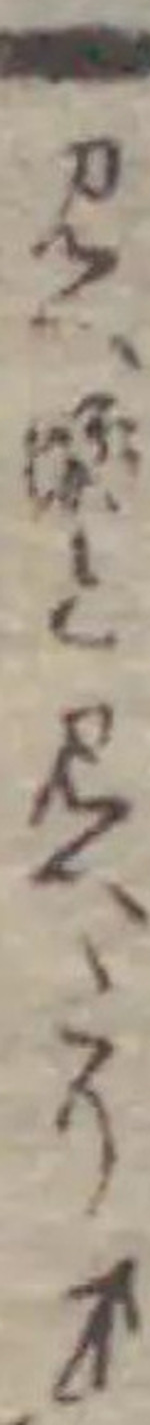見へと見へたり
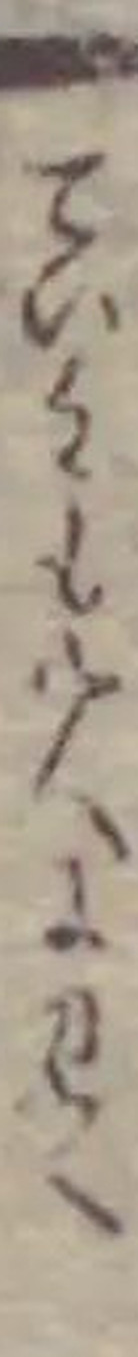てい主も八人に見へ
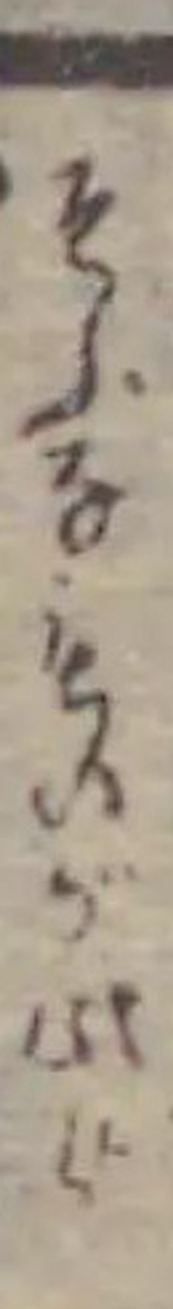そふなものが此女
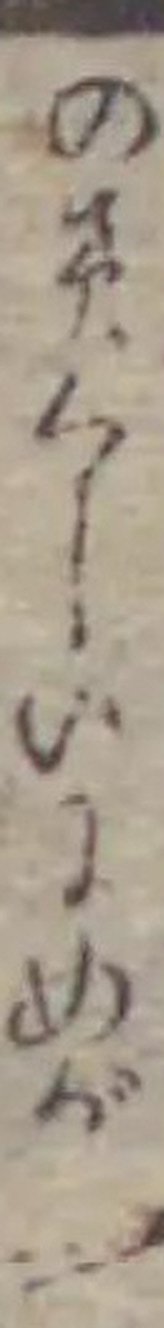の美くしいにめが
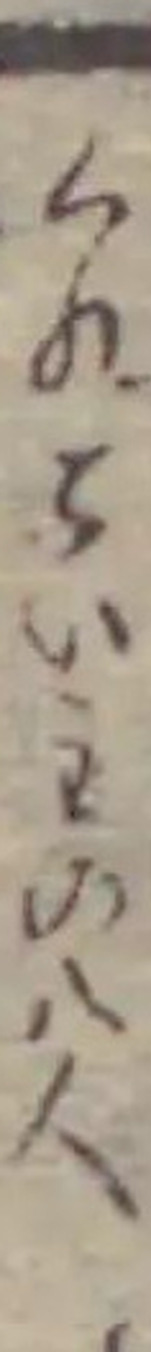くれてい主の八人
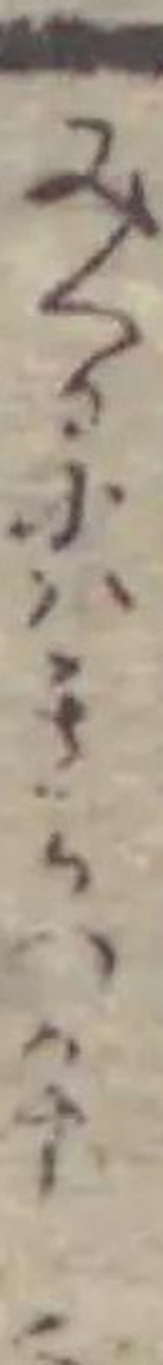みへるにはきかつかす
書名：栄増眼鏡徳 3巻
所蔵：国立国会図書館 National Diet Library, JAPAN
